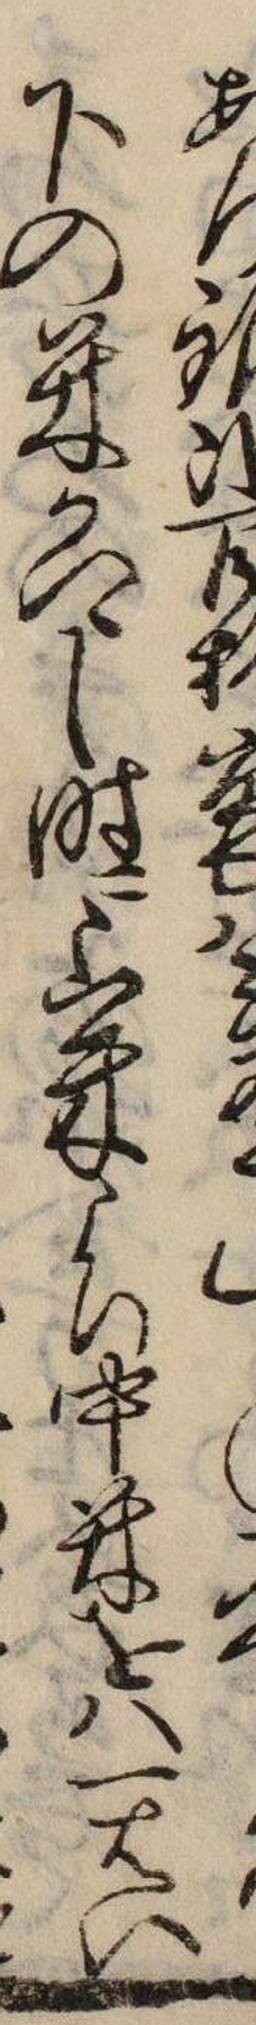下の米かい申時に上米より中米をは一はい
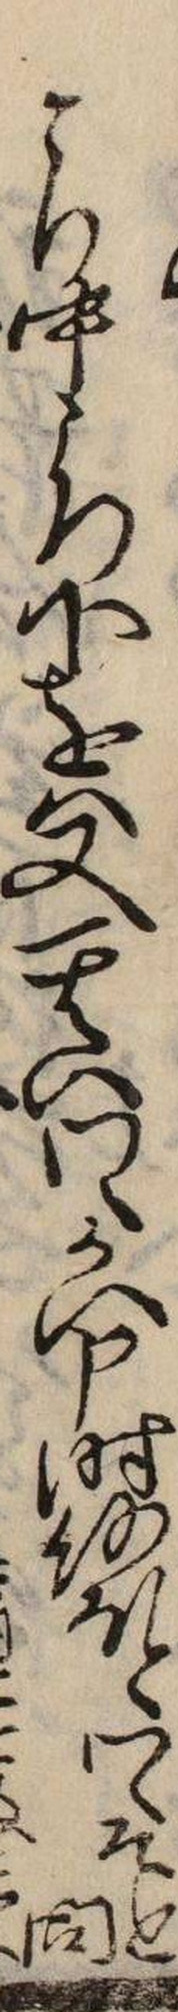とり中より下をは又一はいつゝかい申時何ほとつゝそと問
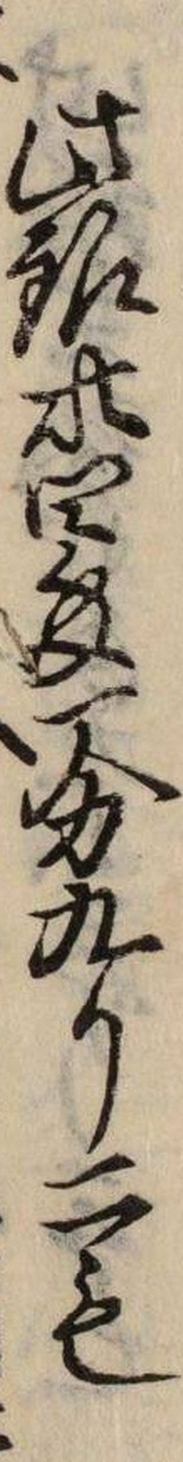此銀卅四匁一分九厘二毛
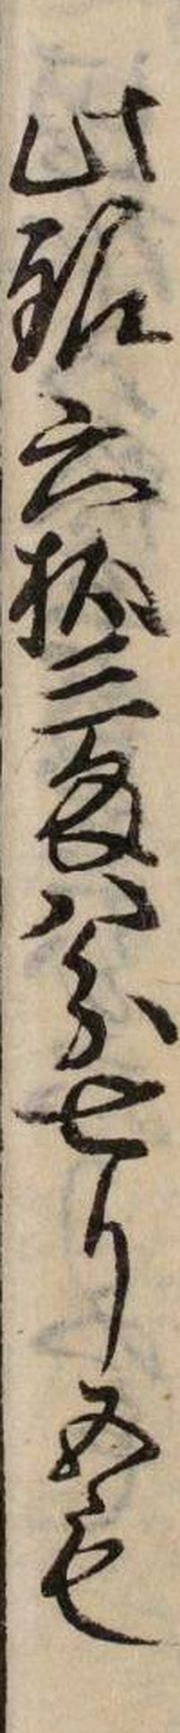此銀六拾三匁八分七り五毛
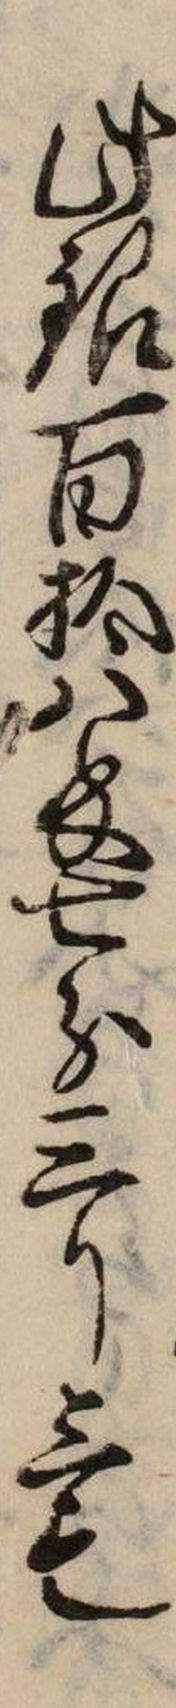此銀百拾八匁七分三厘三毛
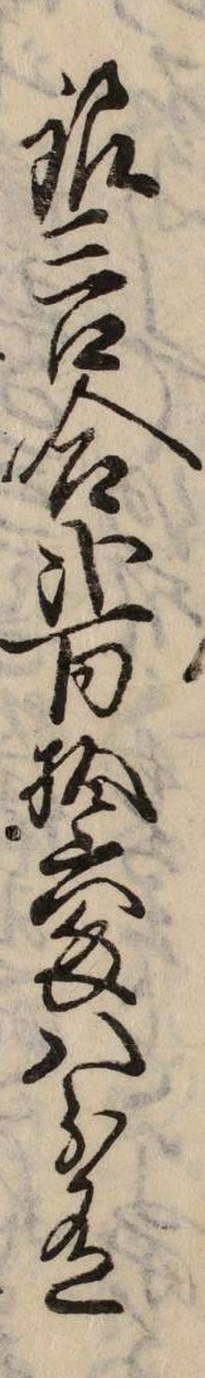銀三口合弐百拾六匁八分有
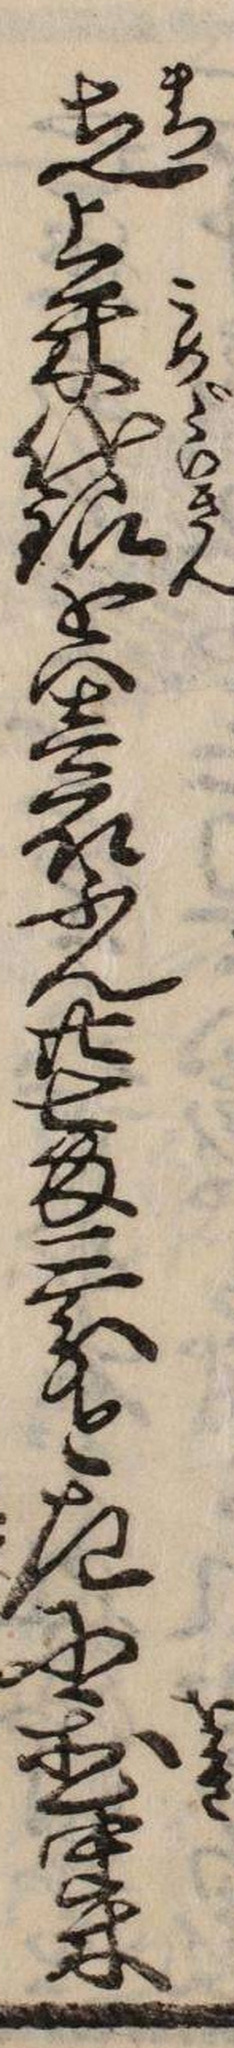先上米代銀をは壱石ふん廿七匁三分と左に置中米
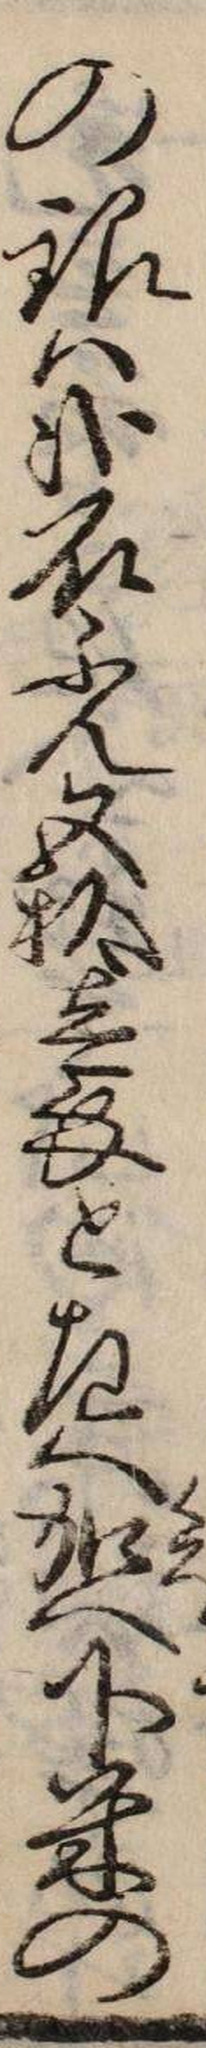の銀は弐石ふん五拾壱匁と左へ加へ下米の
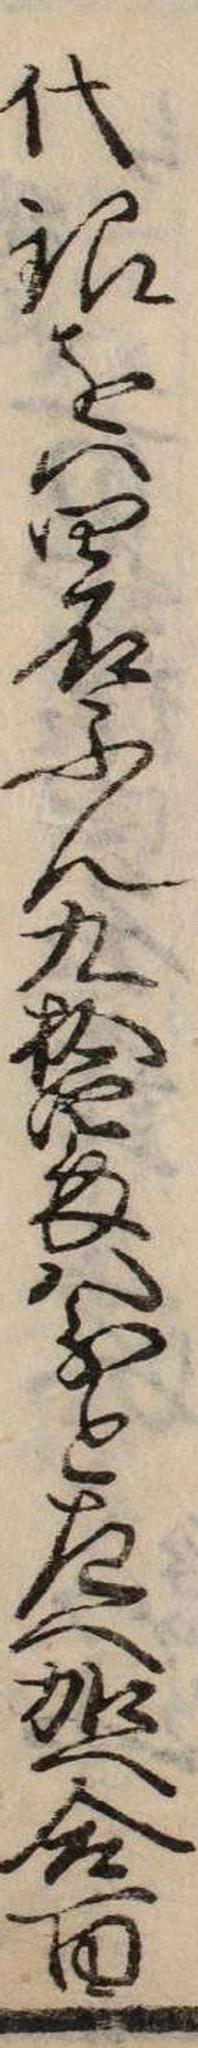代銀をは四石ふん九拾四匁八分と左へ加へ合百
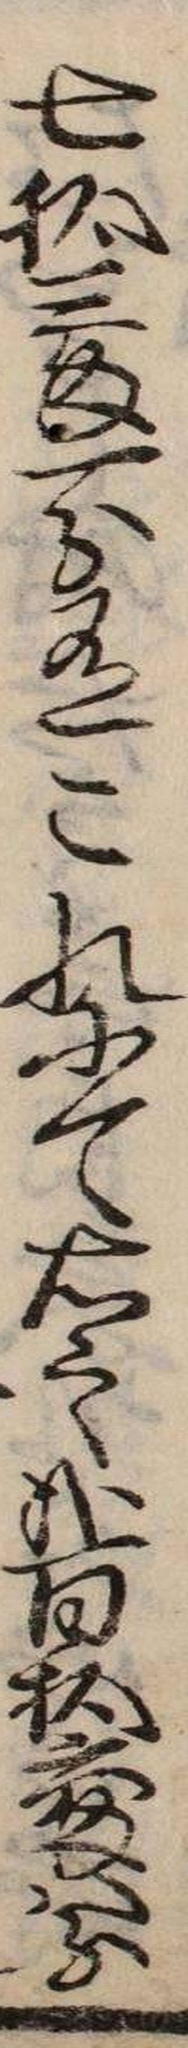七拾三匁一分有これにて右の弐百拾六匁八分
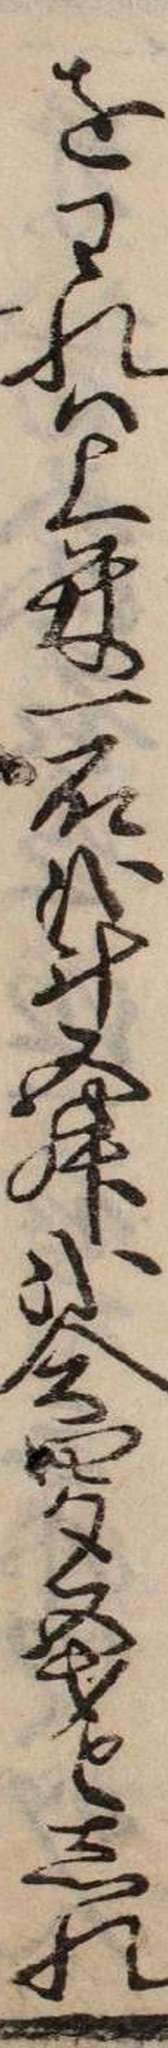をわれは上米一石弐斗五舛弐合四勺五才としれ
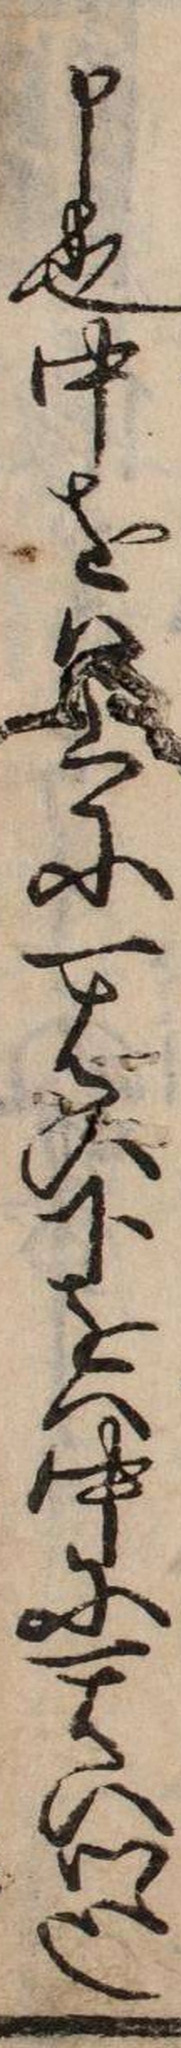申也中をは上に一はい下をは中に一はいつゝ也

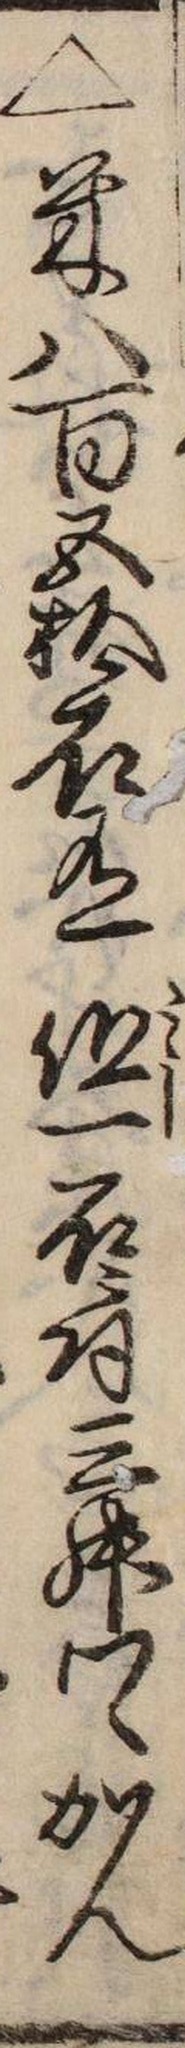△米八百五拾石有但一石に付三舛つゝかん
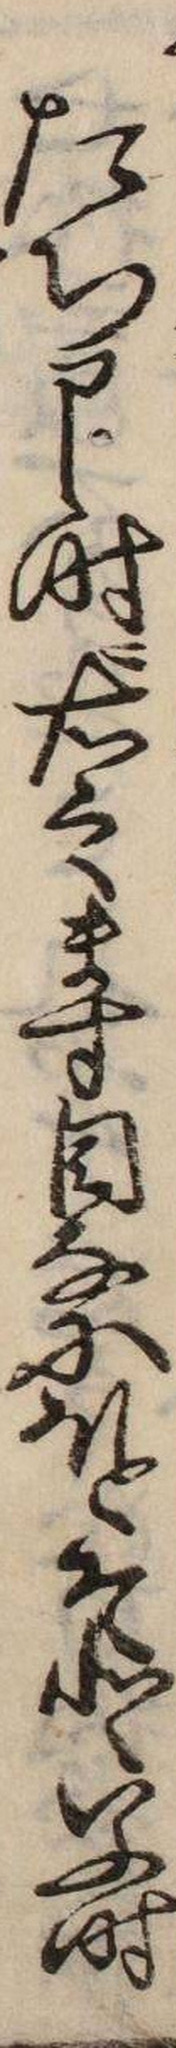たち申時に右のます目なにほとそといふ時
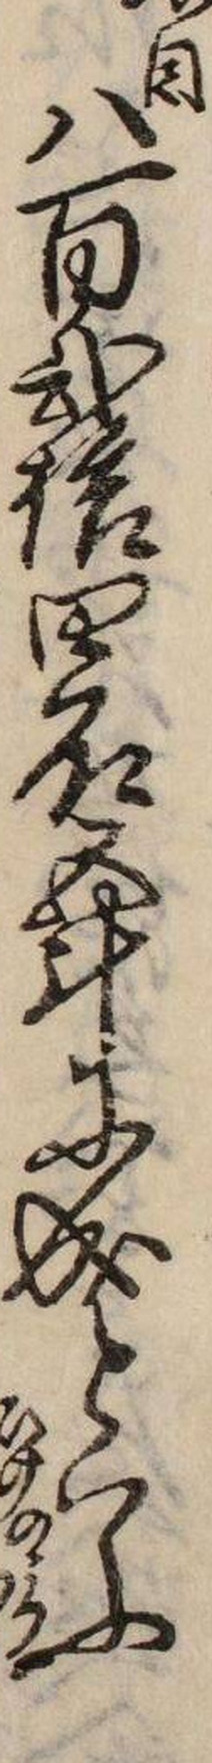残目八百弐拾四石五斗に成といふ
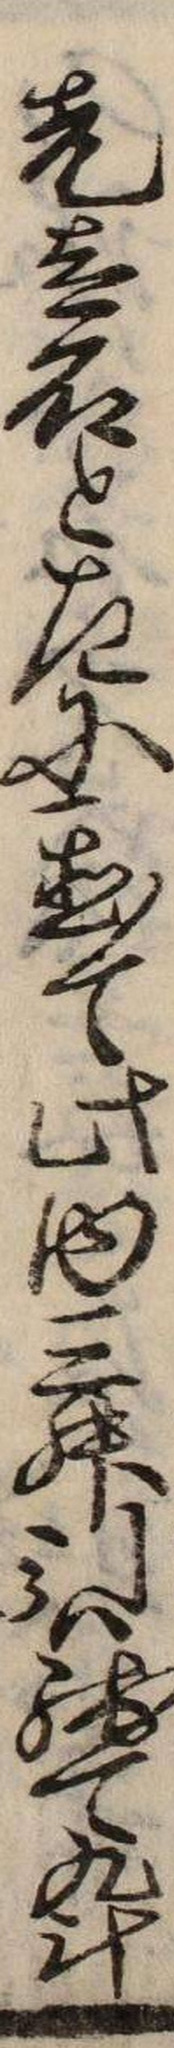先壱石と左に置て此内三舛引は残て九斗
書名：塵劫記（寛永11年自跋、京都府立京都学・歴彩館追貴8）
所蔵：京都府立京都学・歴彩館 国文学研究資料館
